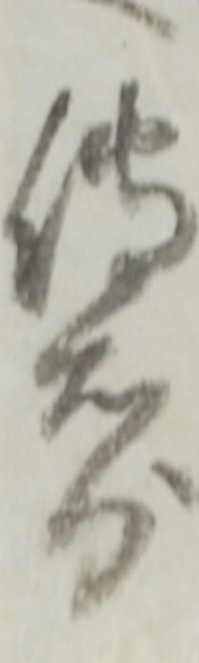伝右衛門
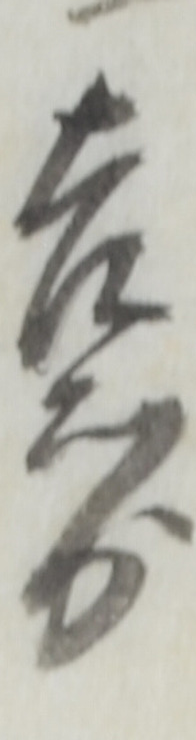伝右衛門
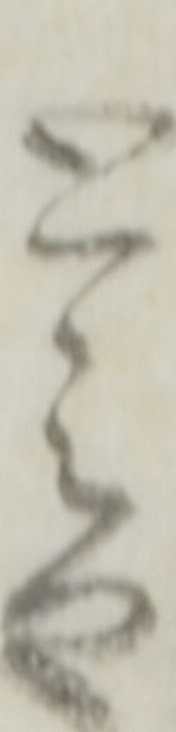とミや
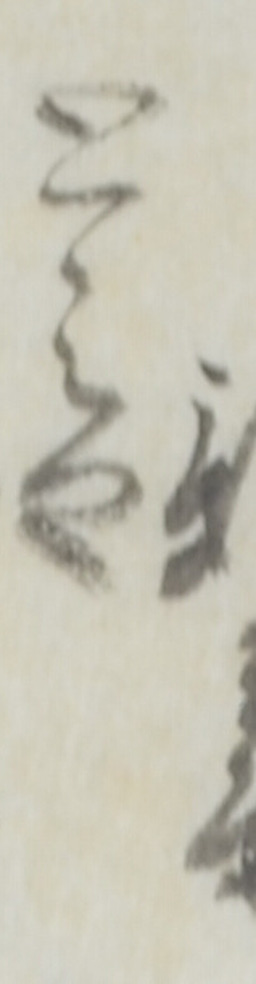とミや
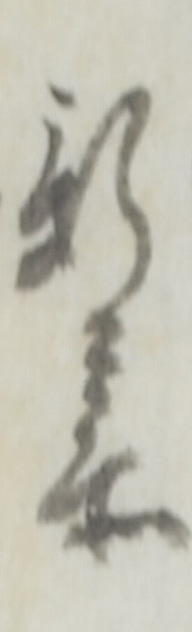新兵衛
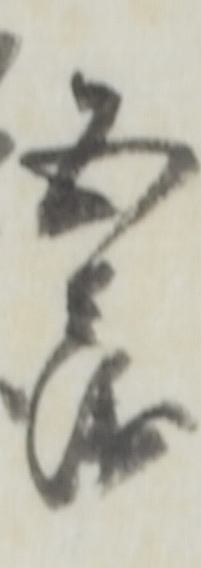五兵衛
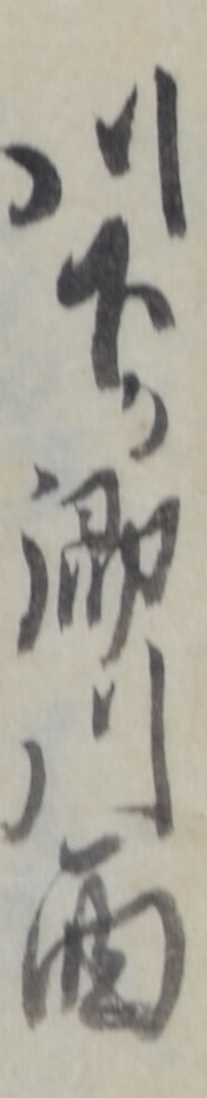川下り郷川東

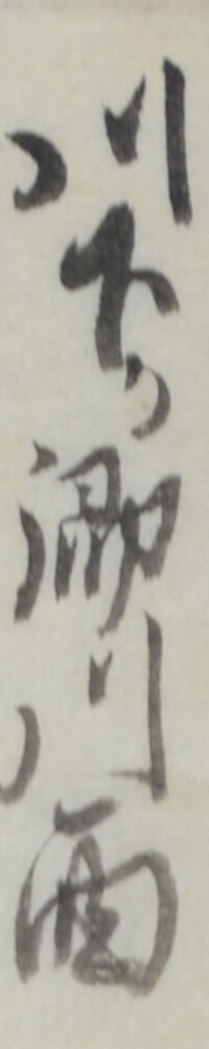川下り郷川西
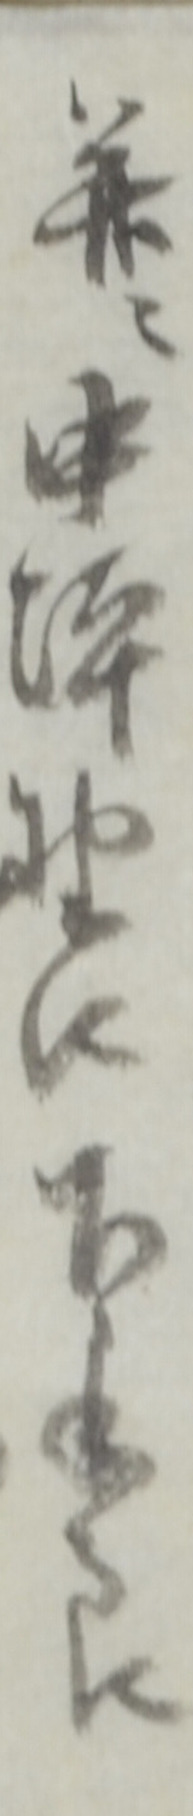幷ニ中坪野口下手良
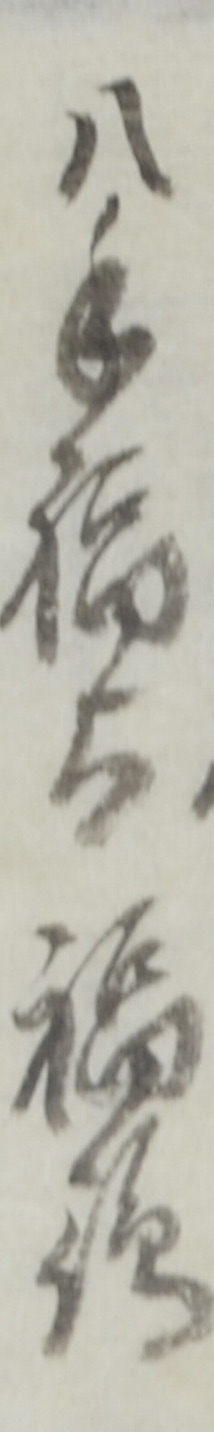八手福与福嶋
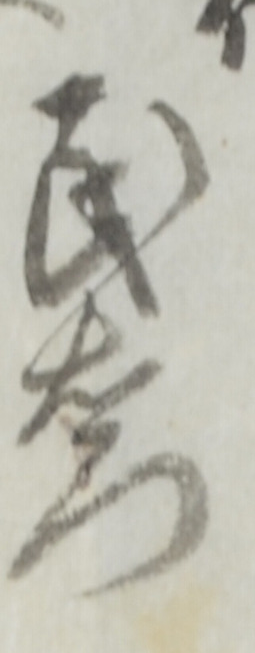民右衛門
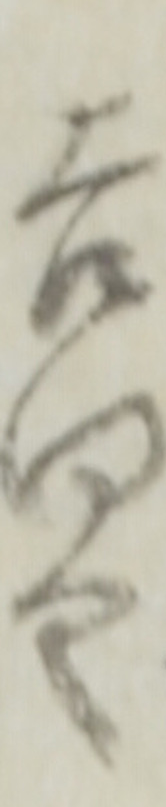吉田や
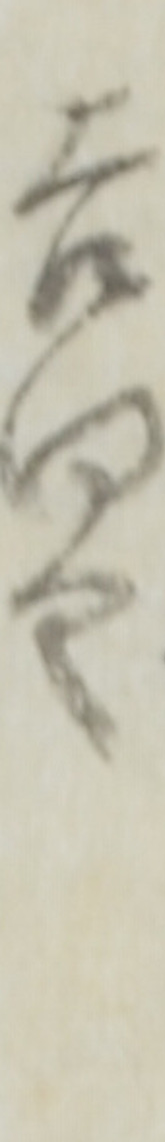吉田や
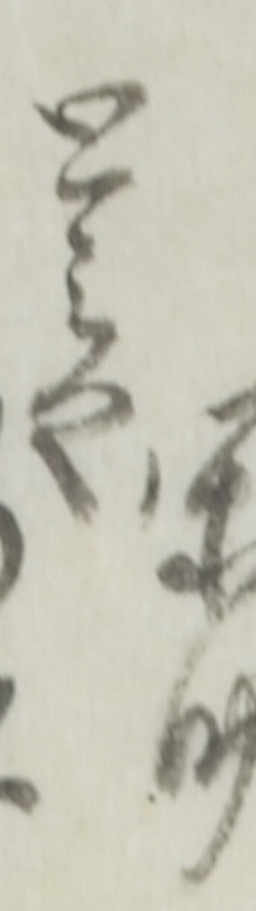とミや
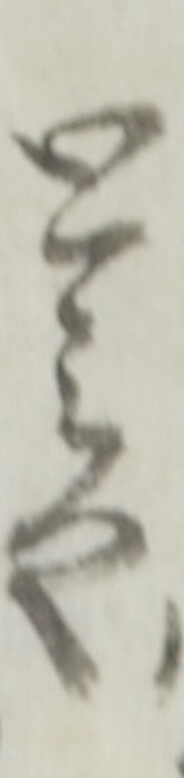とミや
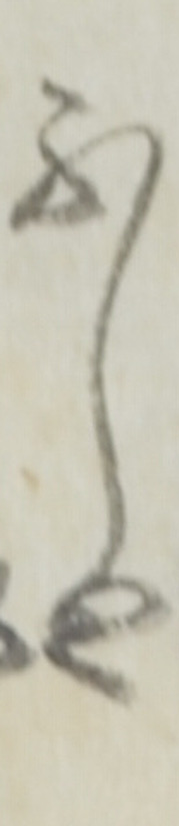ふしや
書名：勧化人割帳
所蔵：伊那市立高遠町図書館・合同会社AMANE
